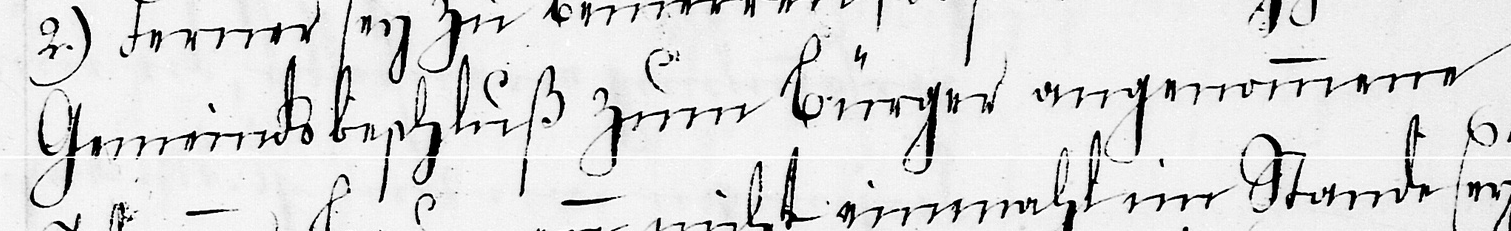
Gemeindsbeschluß zum Bürger angenommene
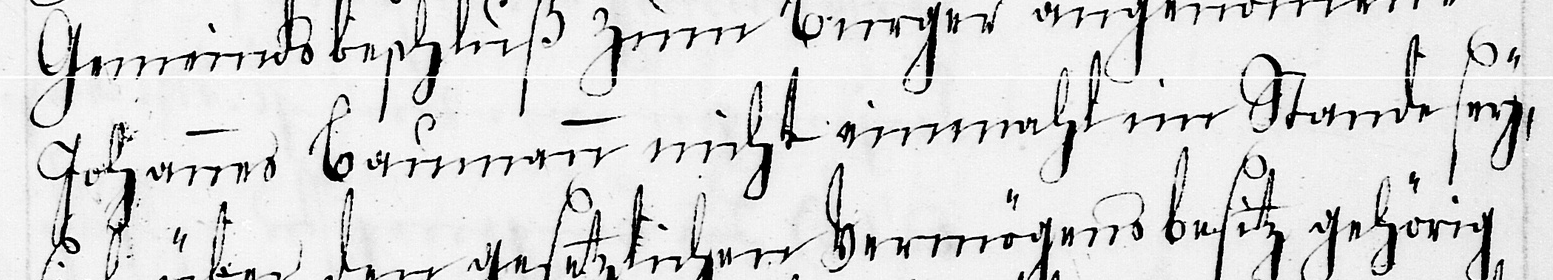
Johannes Baumann nicht einmahl im Stande sey,
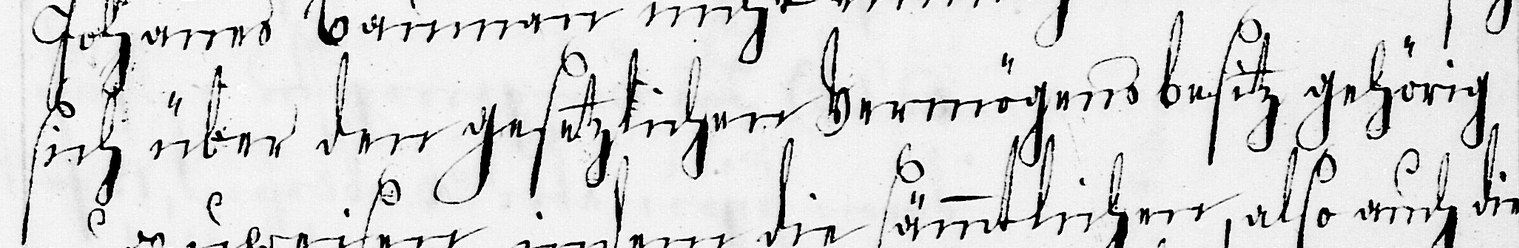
sich über den gesetzlichen Vermögensbesitz gehörig
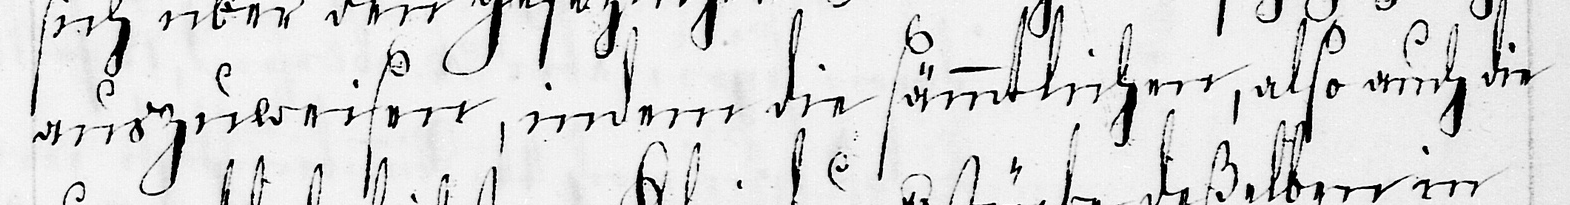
auszuweisen, indem die sämmtlichen, also auch die
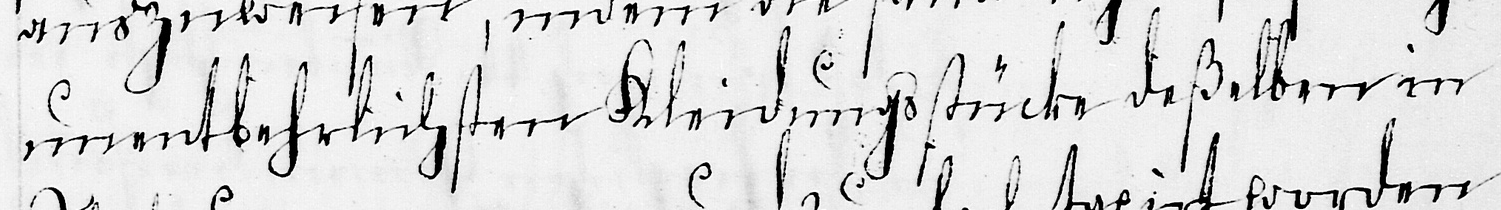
unentbehrlichsten Kleidungsstücke deßelben in
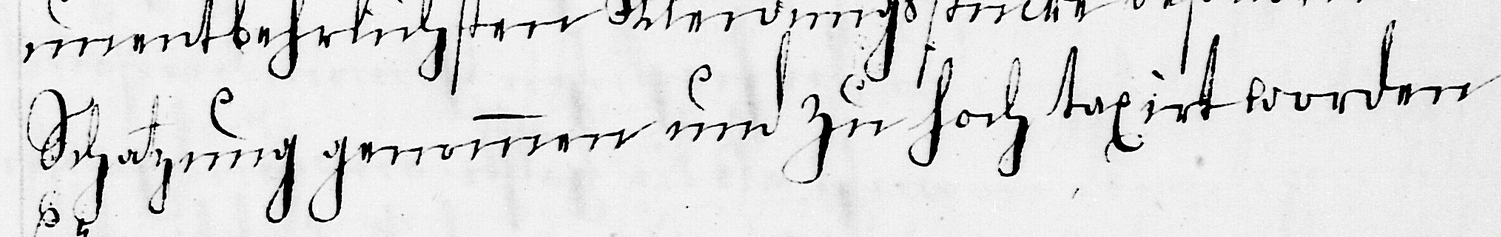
Schatzung genommen und zu hoch taxirt worden
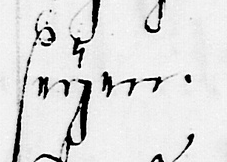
seyen.
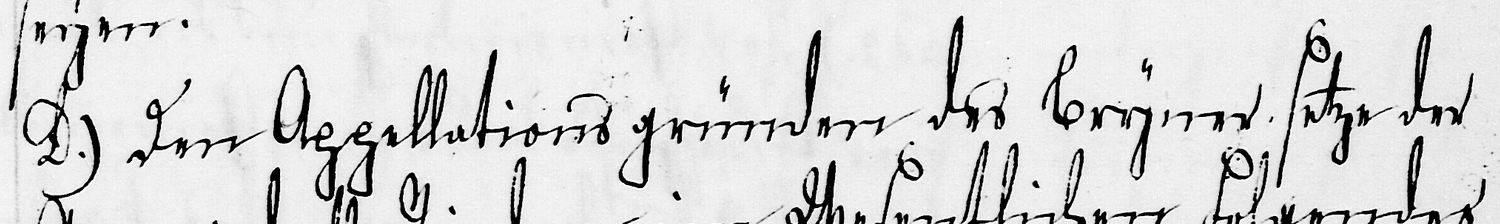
D.) Den Appellationsgründen des Bryner setze der
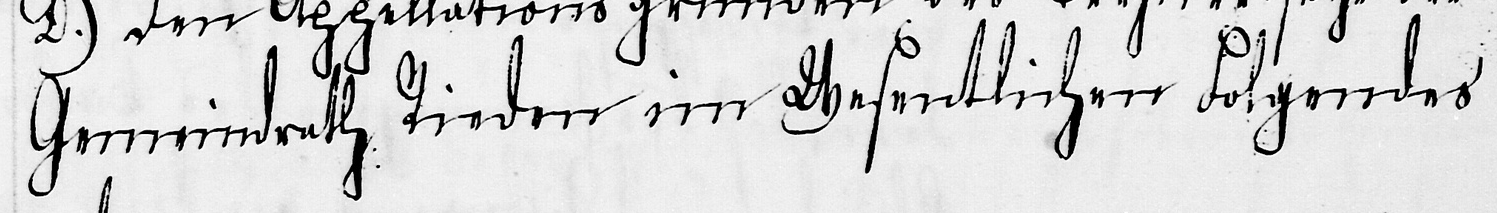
Gemeindrath Rieden im Wesentlichen Folgendes
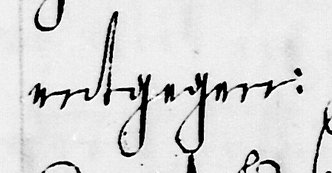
entgegen:
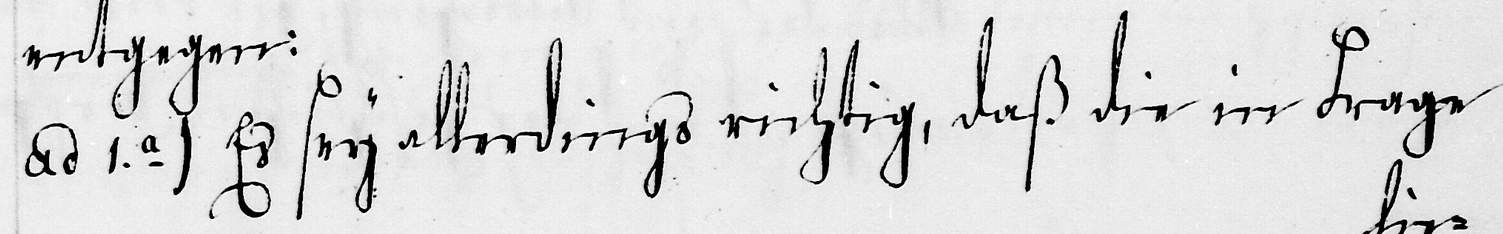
ad 1.a) Es sey allerdings richtig, daß die in Frage
